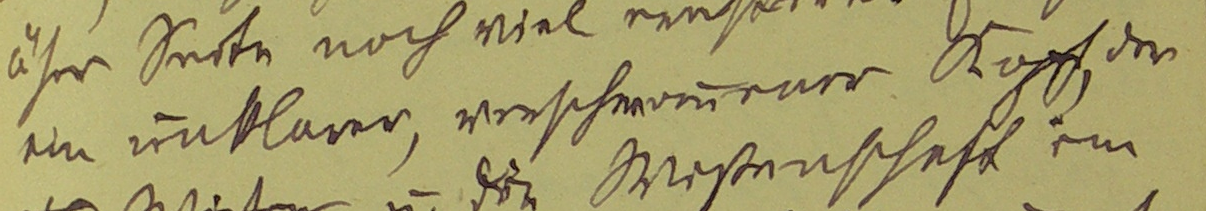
ein unklarer, verschwommener Kopf der
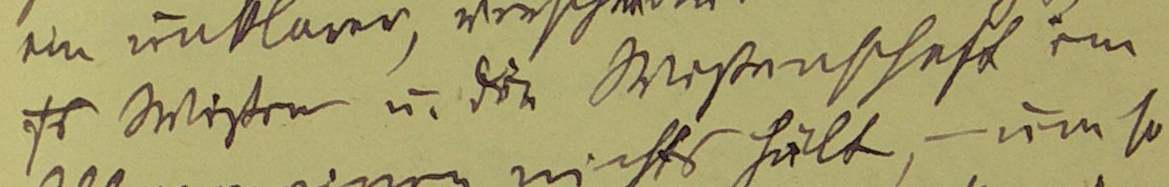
von Wißen und Wißenschaft im
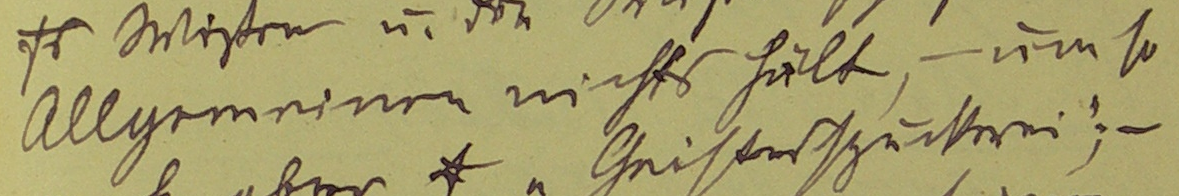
Allgemeinen nichts hält,-- umso
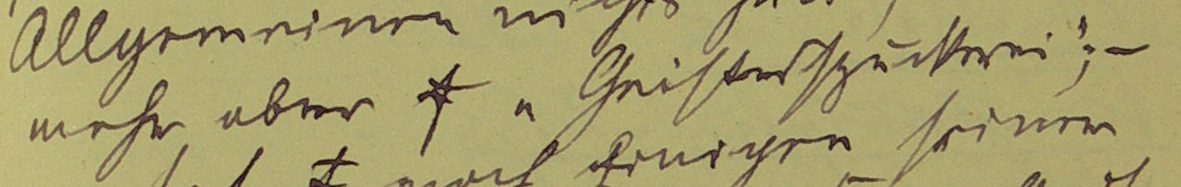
mehr aber von „Geisterspuckerei“;-
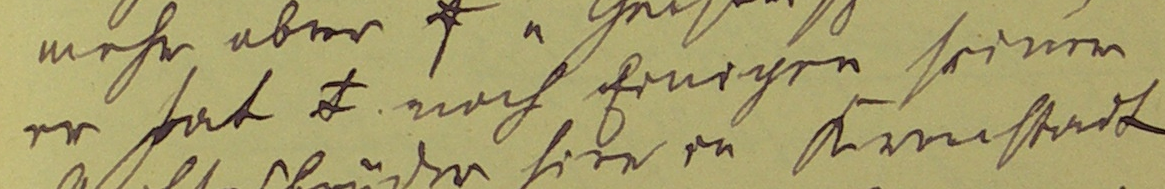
er hat mit noch Einigen seiner
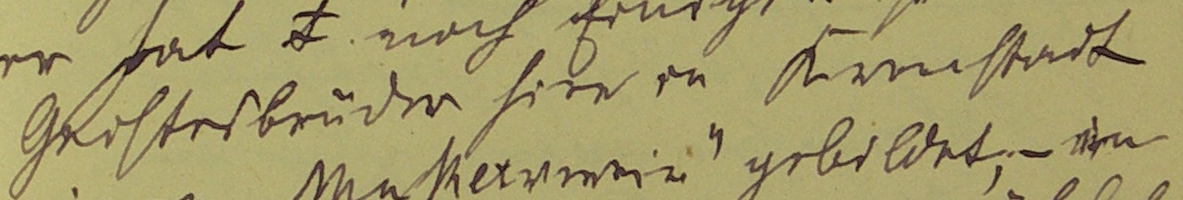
Geisterbrüder hier in Kronstadt
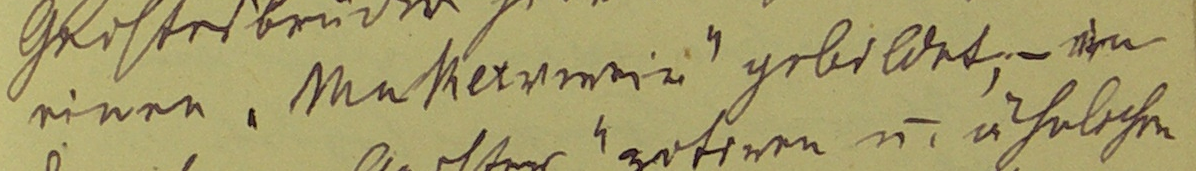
einen „Mukerverein..“ gebildet ,- in
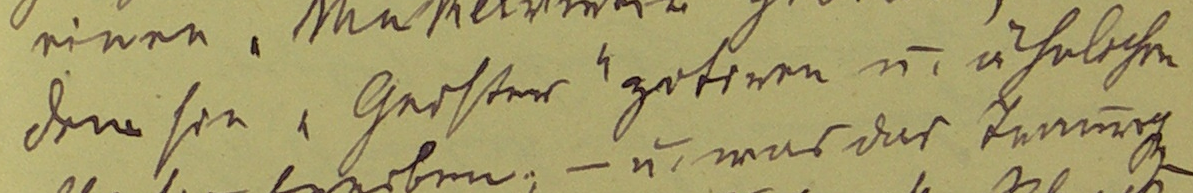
dem sie „Geister“ zitieren und ähnlichen
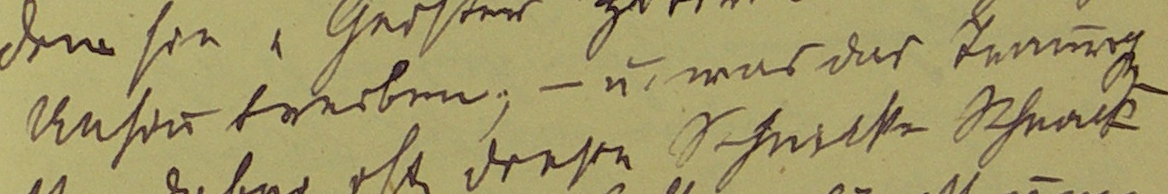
Unsinn treiben; - und was Traurig¬
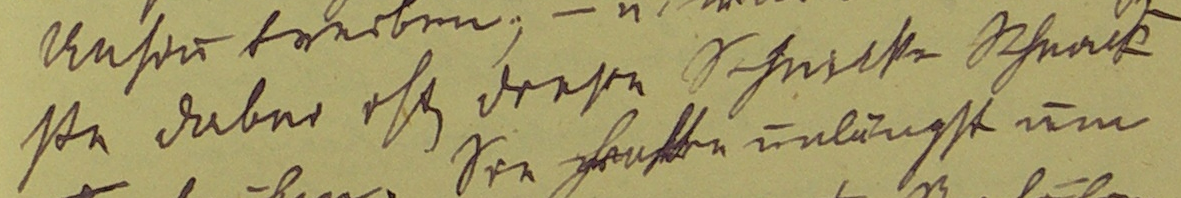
ste dabei ist diesen Schnick-Schnack
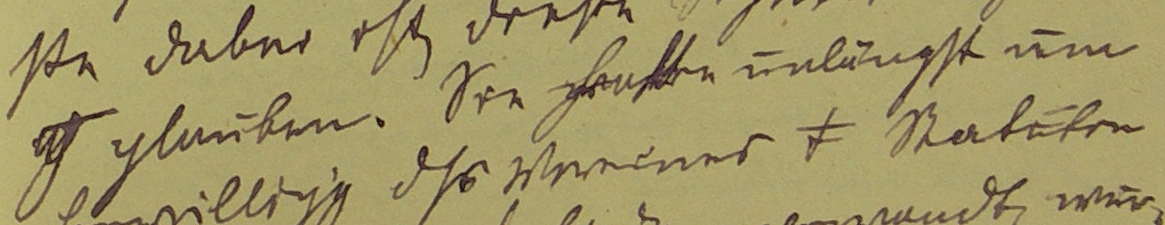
zu glauben.- Sie hatten unlängst um
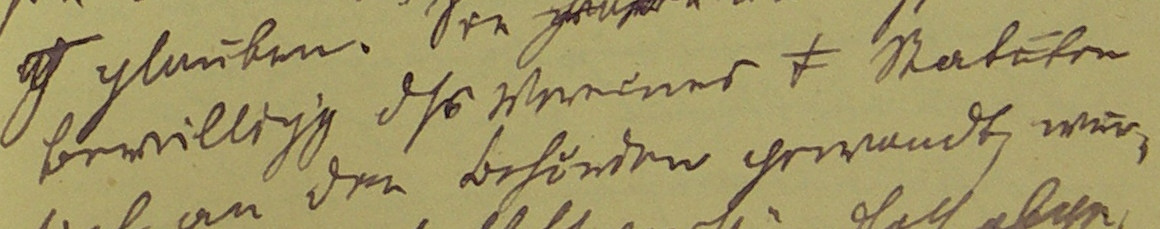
Bewilligung dieses Vereins mit Statuten
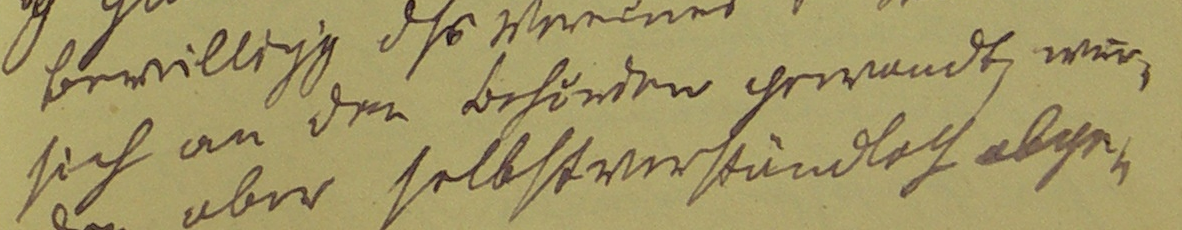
sich an die Behörden gewandt , wurden
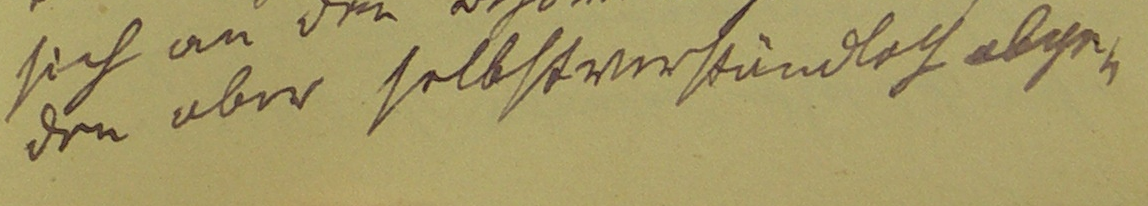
dann aber selbstverständlich abgelehnt.
